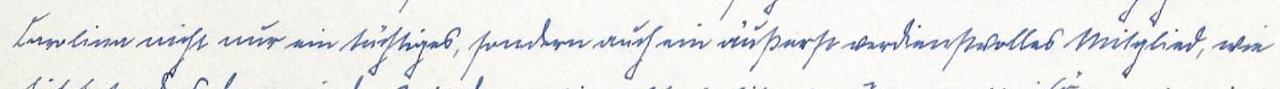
Carolina nicht nur ein tüchtiges, sondern auch ein äußerst verdienstvolles Mitglied, wie
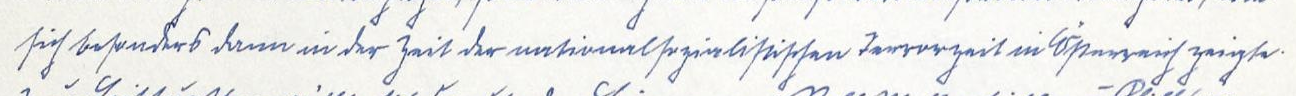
sich besonders dann in der Zeit der nationalsozialistischen Terrorzeit in Österreich zeigte.
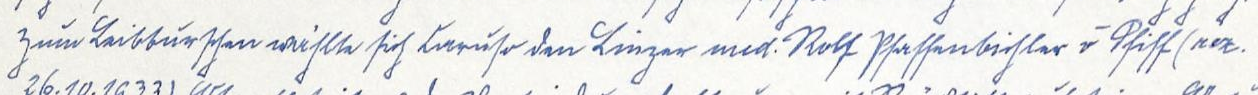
Zum Leibburschen wählte sich Caruso den Linzer med. Rolf Pfaffenbichler v/o Pfiff (rez.
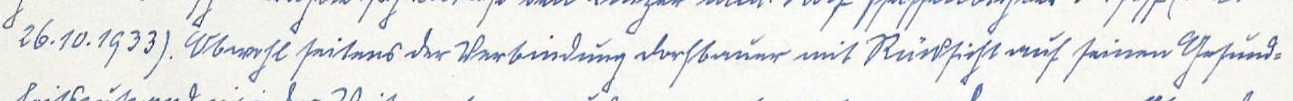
26. 10. 1933). Obwohl seitens der Verbindung Dorfbauer mit Rücksicht auf seinen Gesund-
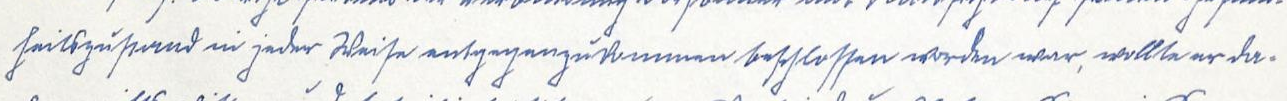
heitszustand in jeder Weise entgegenzukommen beschlossen worden war, wollte er da-
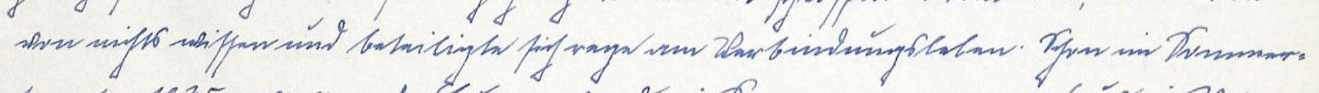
von nichts wissen und beteiligte sich rege am Verbindungsleben. Schon im Sommer-
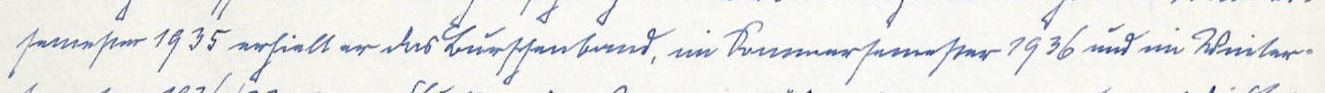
Semester 1935 erhielt er das Burschenband, im Sommersemester 1936 und im Winter-
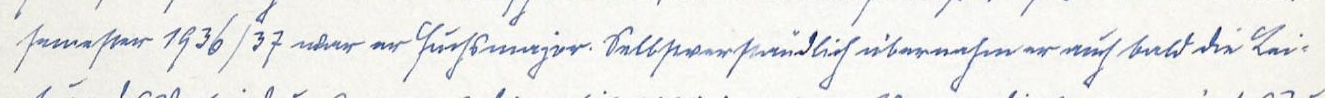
Semester 1936 /37 war er Fuchsmajor. Selbstverständlich übernahm er auch bald die Leit-
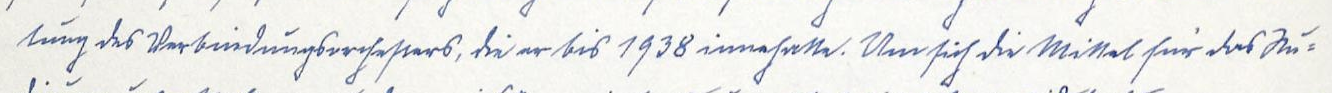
ung des Verbindungsorchesters, die er bis 1938 innehatte. Um sich die Mittel für das Stu-
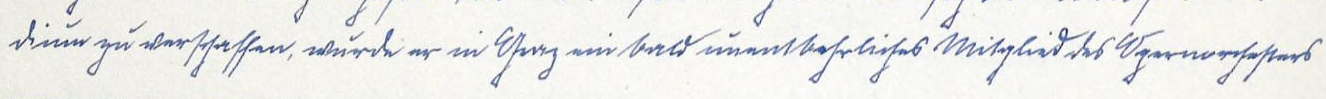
dium zu verschaffen, wurde er in Graz ein bald unentbehrliches Mitglied des Opernorchesters
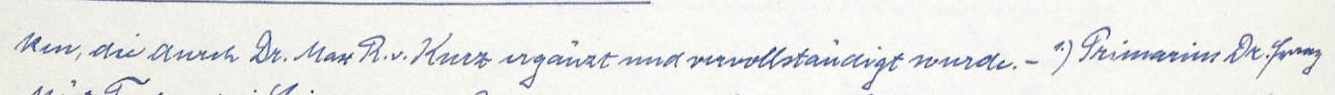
ken, die durch Dr. Max R. v. Kurz ergänzt und vevrollständigt wurde. 1) Primarius Dr Franz
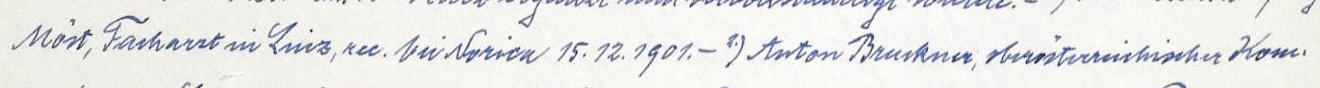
Köst, Facharzt in Linz, rez. bei Norica 15. 12. 1901.- 3) Anton Brukner, oberösterreichischer Kom-
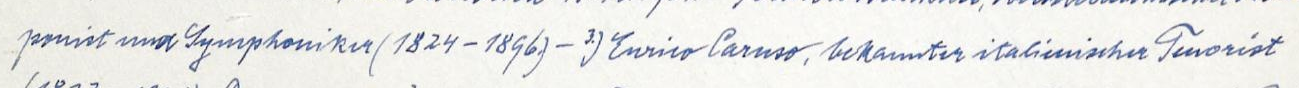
ponist und Symphoniker (1824-1896)- 3) Enrico Caruso, bekannter italienischen Tenor
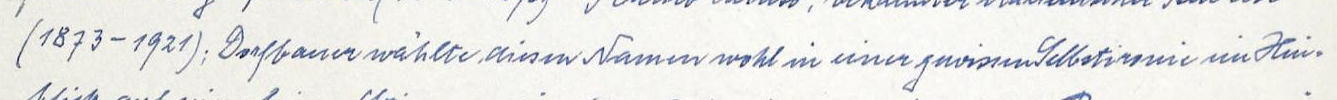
(1873-1921), Dorfbauer wählte diesen Namen wohl in einer gewissen Selbstironie im Hin-
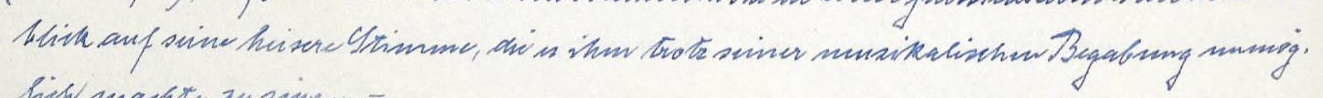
blick auf seine heisere Stimmen, die es ihm trotz seiner musikalischen Begabung unmög-
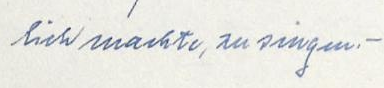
ich machte, zu singen.
